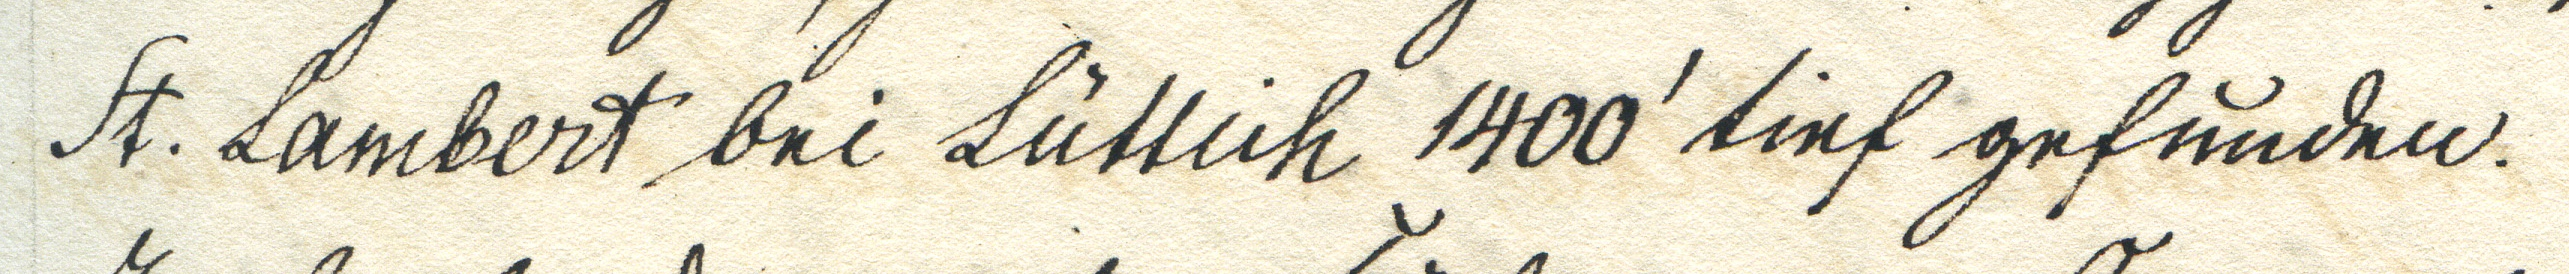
St. Lambert bei Lüttich 1400′ tief gefunden.
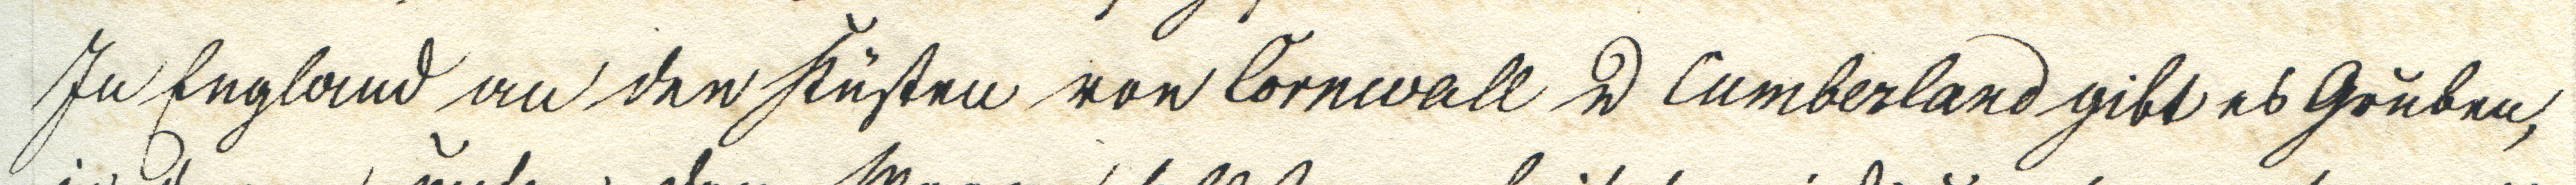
In England an den Küsten von Cornwall u Cumberland gibt es Gruben,
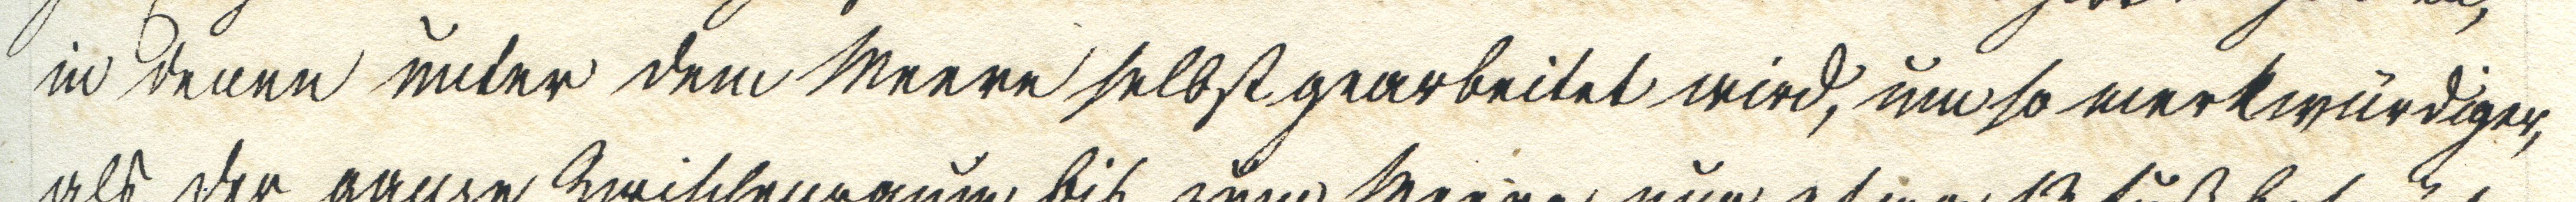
in denen unter dem Meere selbst gearbeitet wird, um so merkwürdiger,
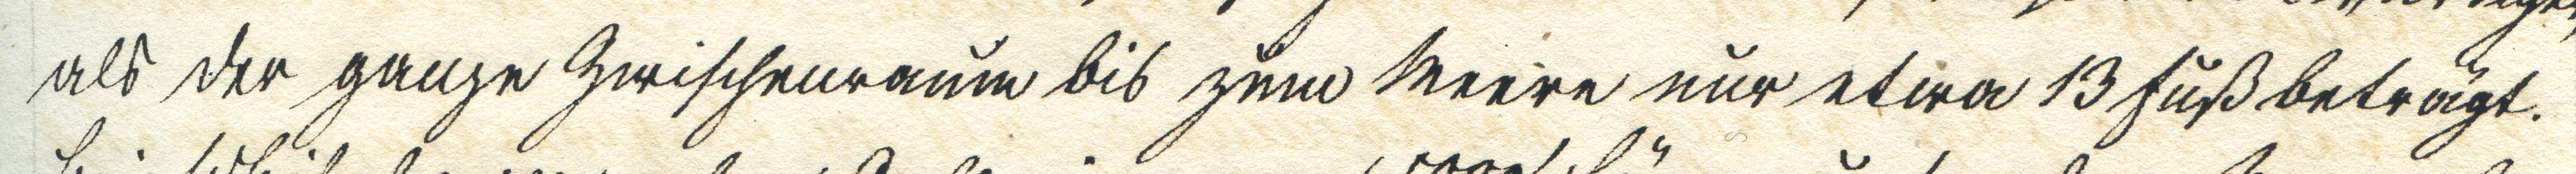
als der ganze Zwischenraum bis zum Meere nur etwa 13 Fuß beträgt.
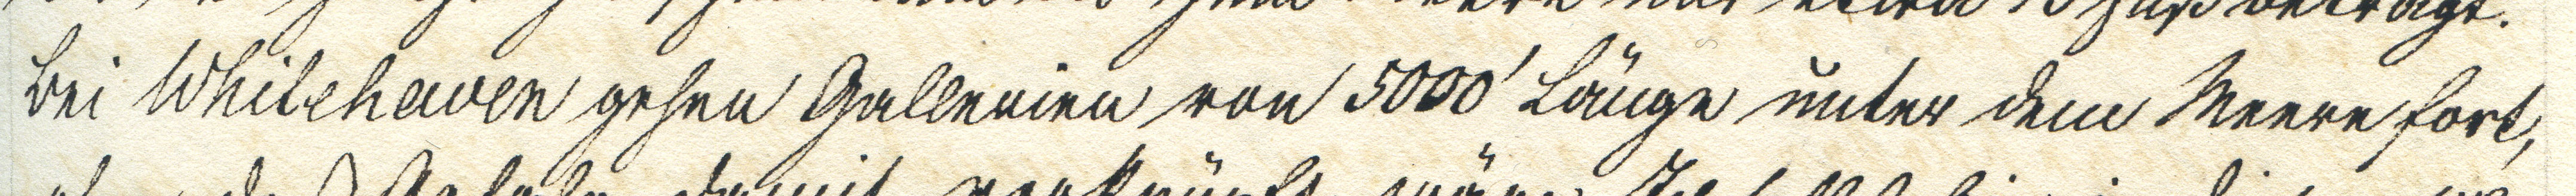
Bei Whitehaven gehen Gallerien von 5000′ Länge unter dem Meere fort,
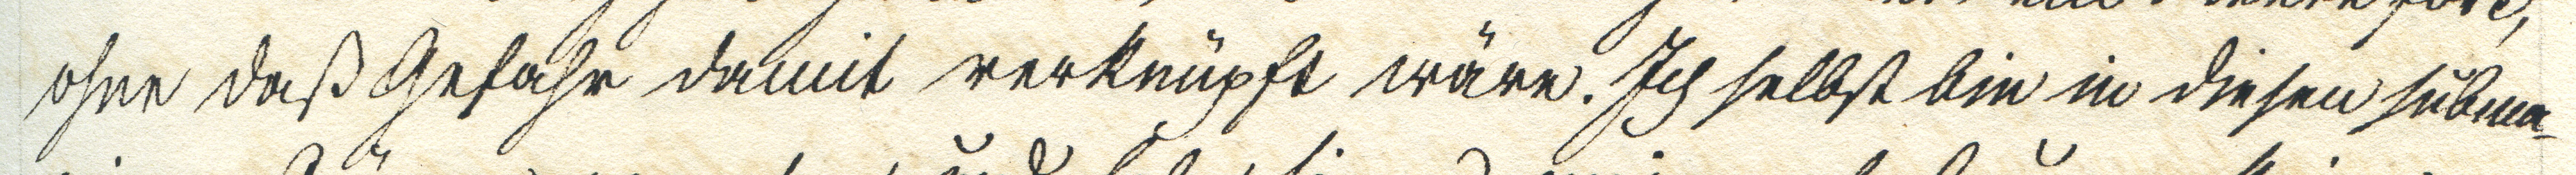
ohne daß Gefahr damit verknüpft wäre. Ich selbst bin in diesen subma-
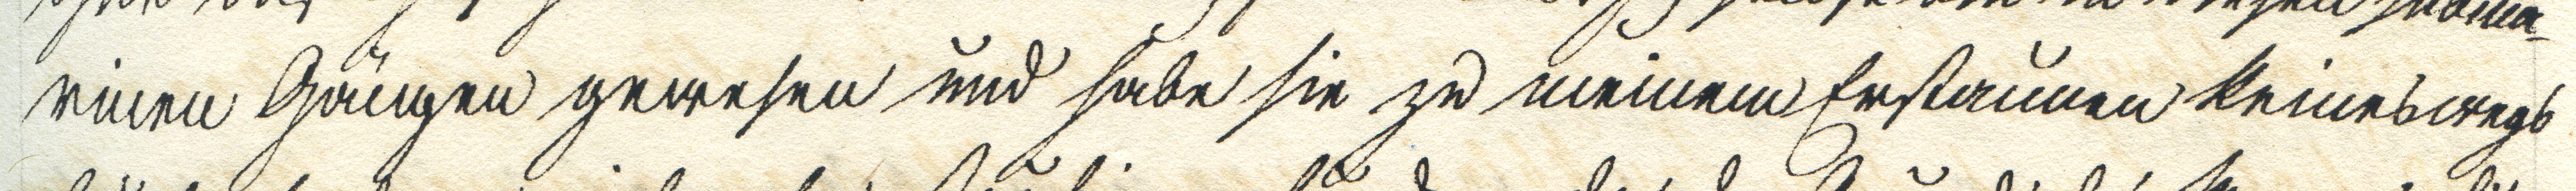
rinen Gängen gewesen und habe sie zu meinem Erstaunen keineswegs
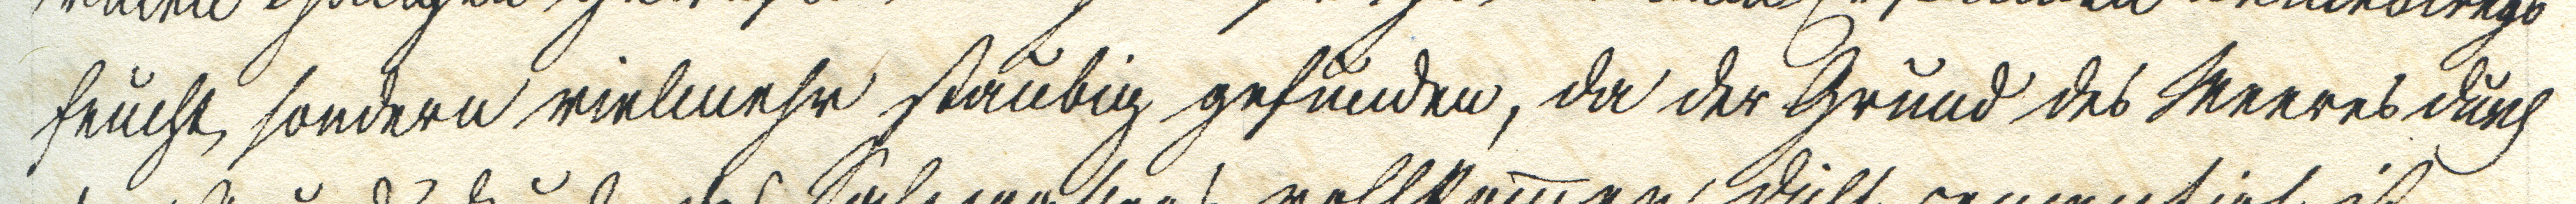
feucht, sondern vielmehr staubig gefunden, da der Grund des Meeres durch
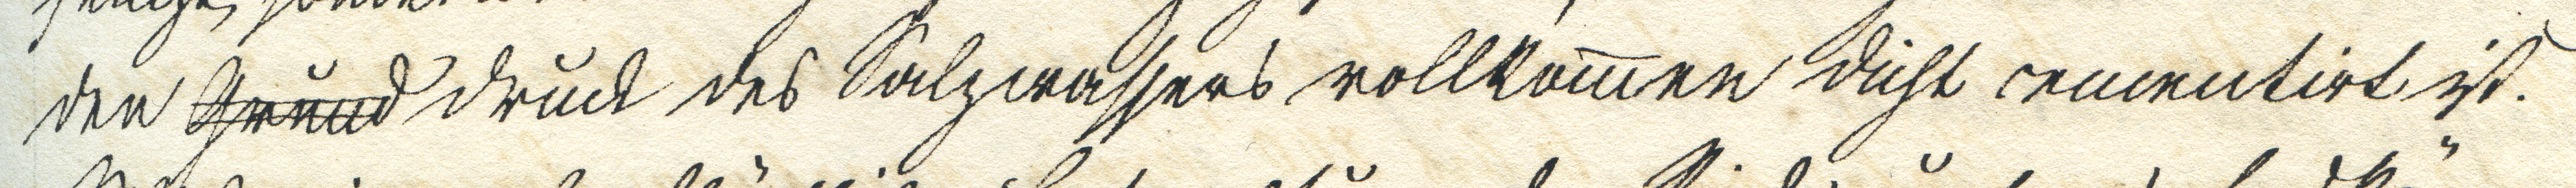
den GrundDruck des Salzwassers vollkom̃en dicht cementirt ist.
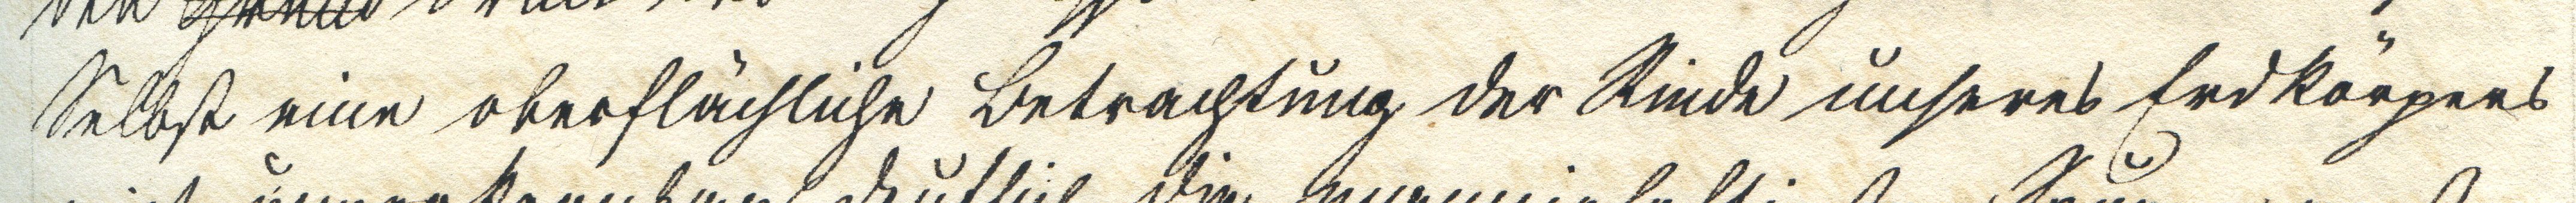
Selbst eine oberflächliche Betrachtung der Rinde unseres Erdkörpers
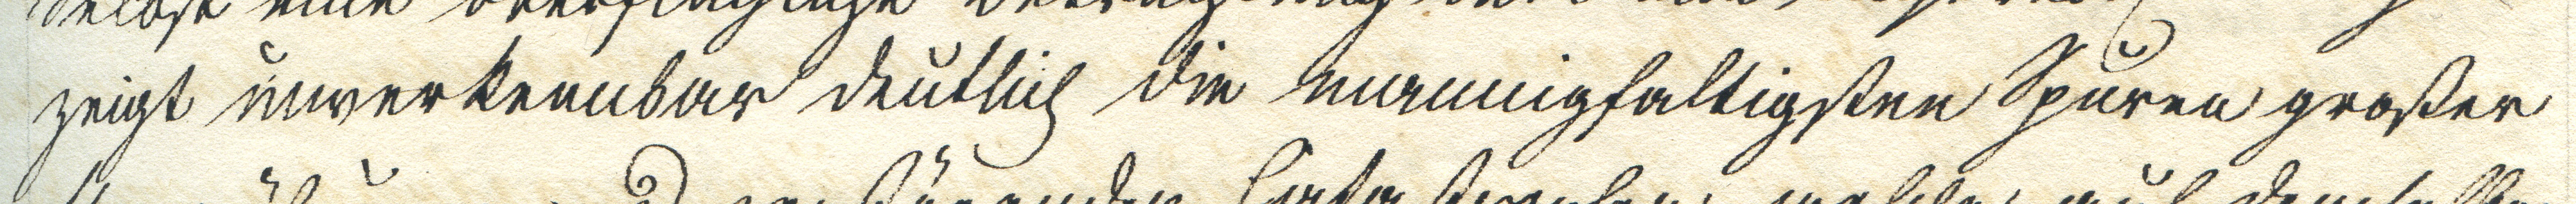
zeigt unverkennbar deutlich die mannigfaltigsten Spuren großer
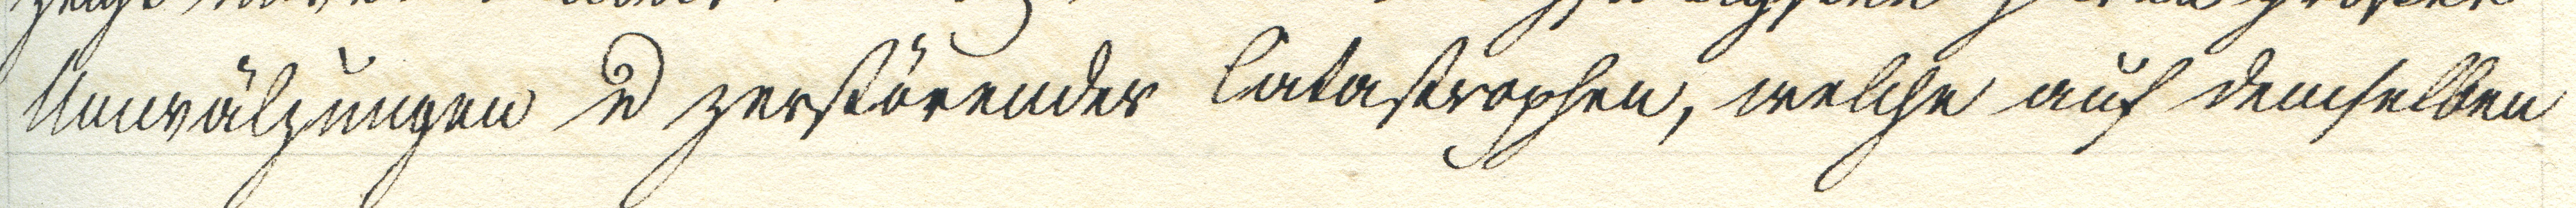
Umwälzungen u zerstörender Catastrophen, welche auf demselben
